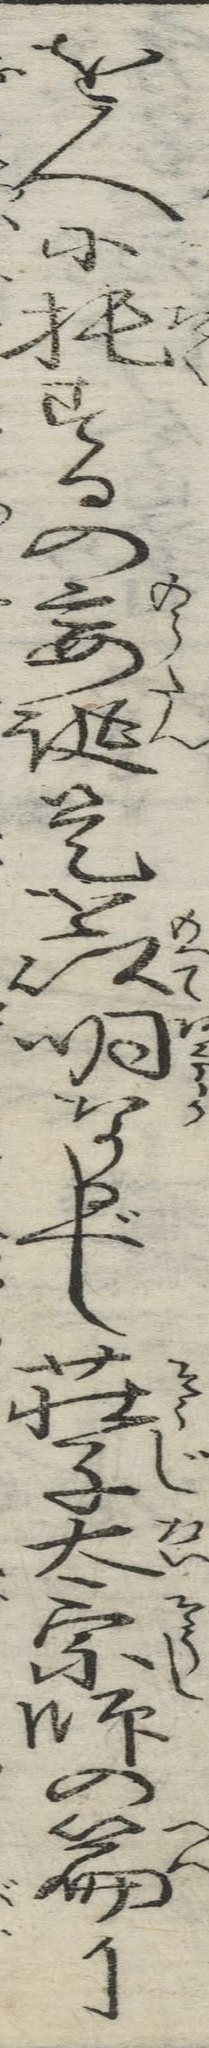を人に托するの妄誕是を以明なるべし荘子太宗師の篇に
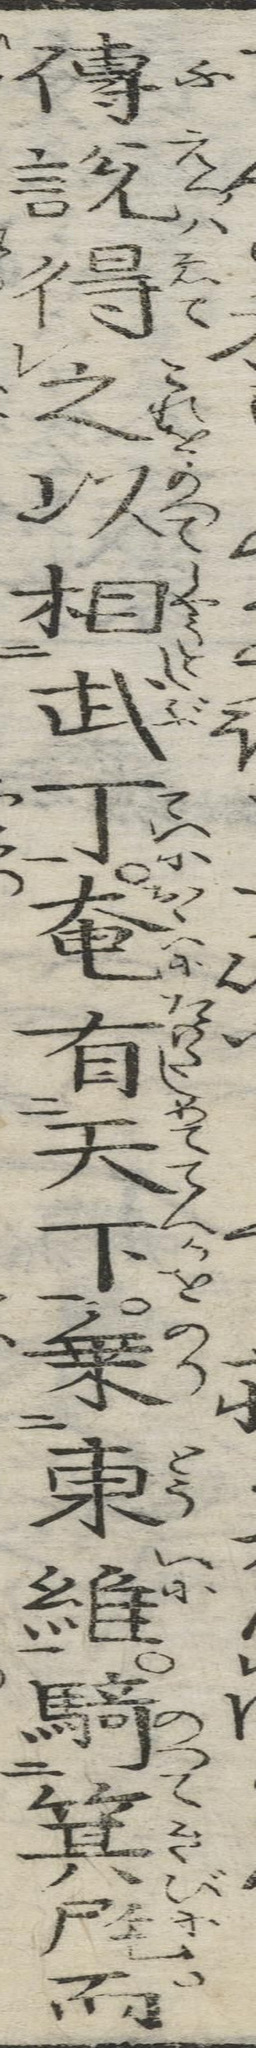傳説得之以相武丁。奄有天下。乗東維。騎箕尾。而
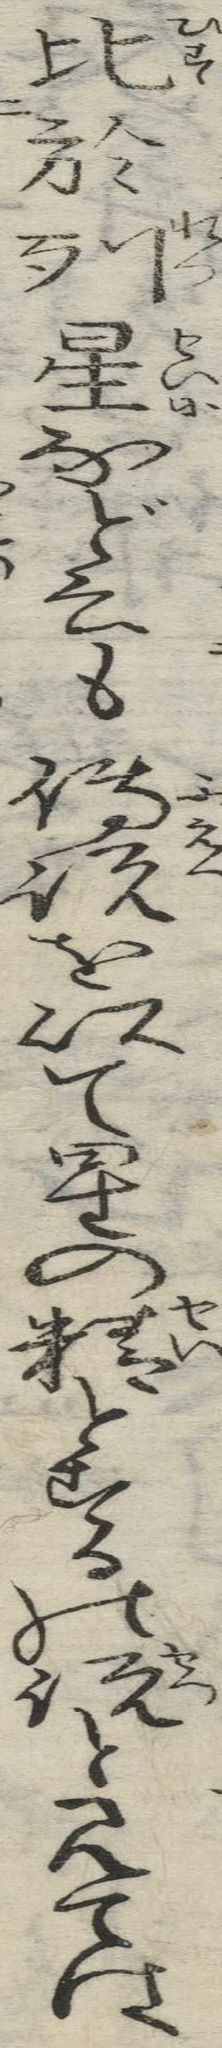比於列星など云も傳説を以て星の精とするの説と見ては
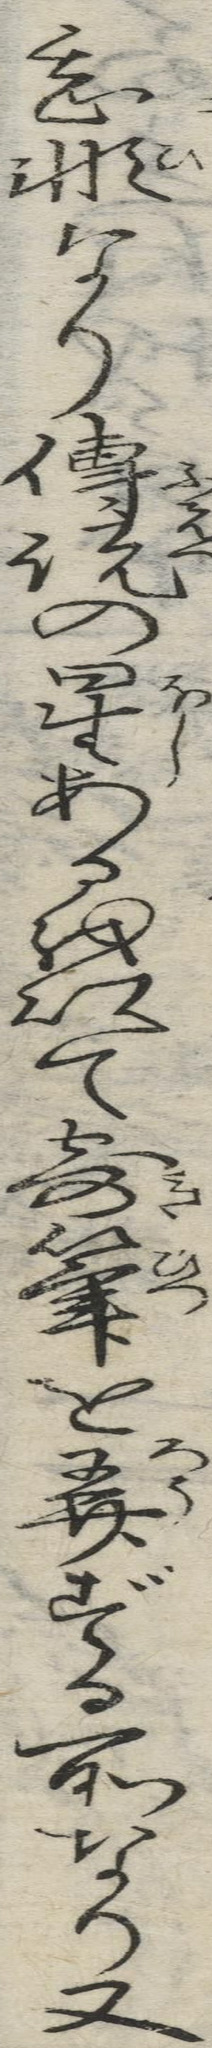甚非なり傳説の星あるを以て奇筆を弄ずる所なり又
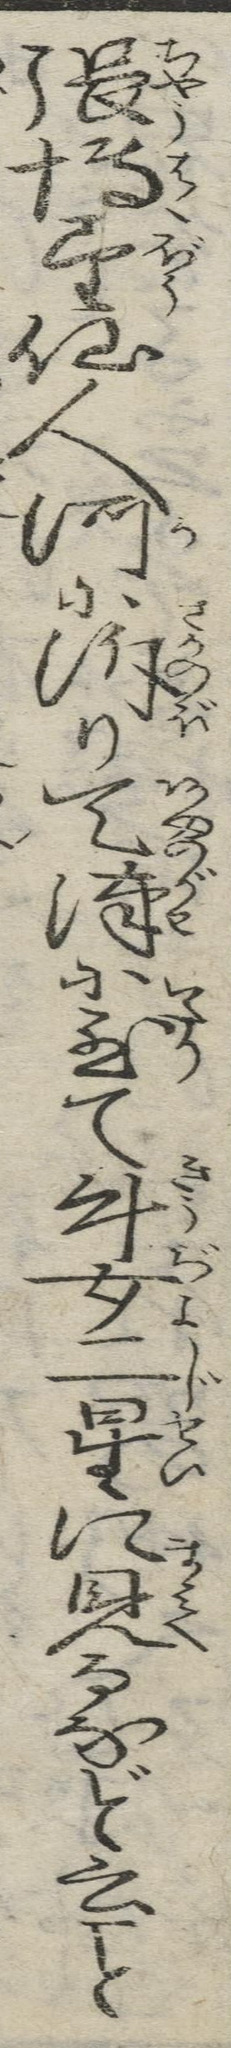張博望仙人河に進り天漢に至て牛女二星に見るなど云こと
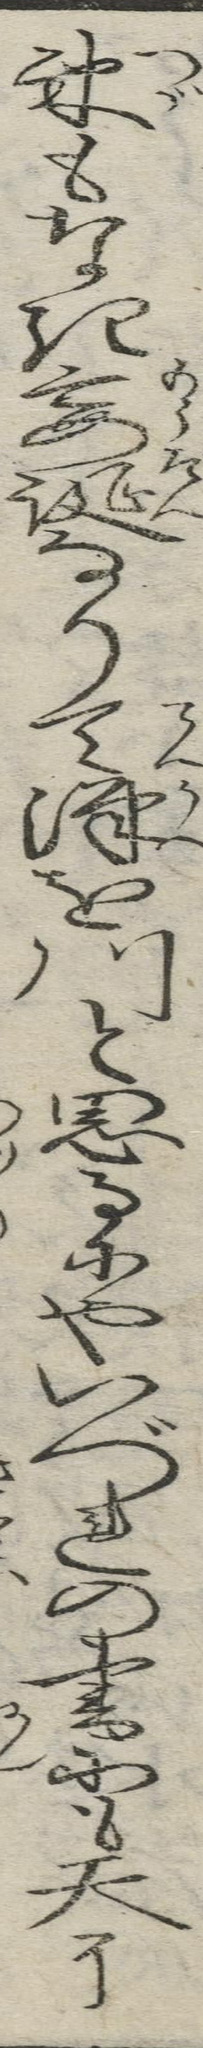次もなき妄誕なり天漢を川と思るにやいづれの書にも天に
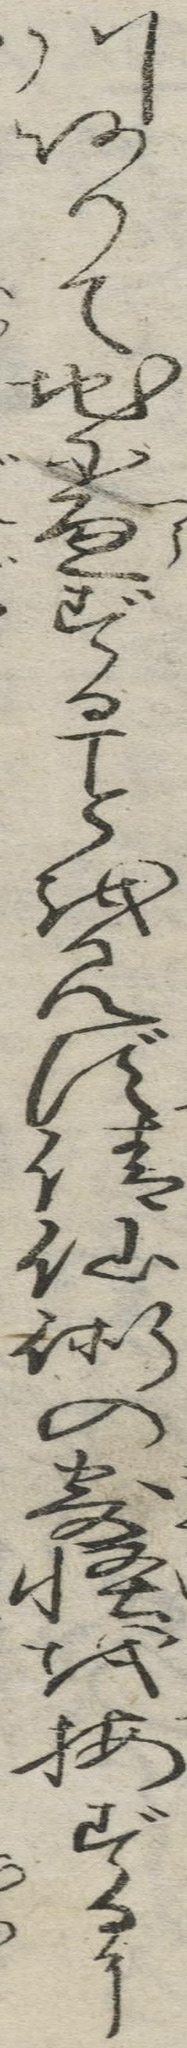川ありて地に通ずることを見ず偆仙術の奇怪を按ずるに
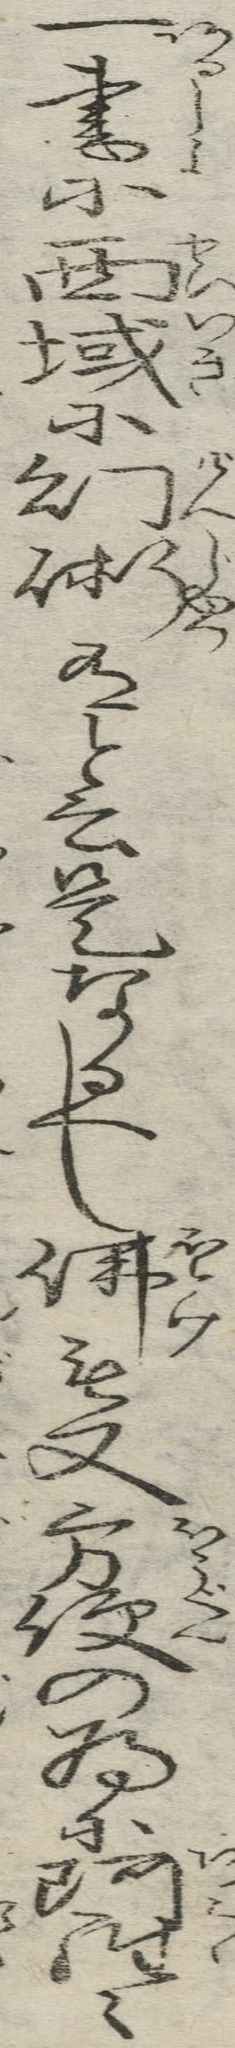一書に西域に幻術有と云是なるへし佛も又方便の為に阿羅〻
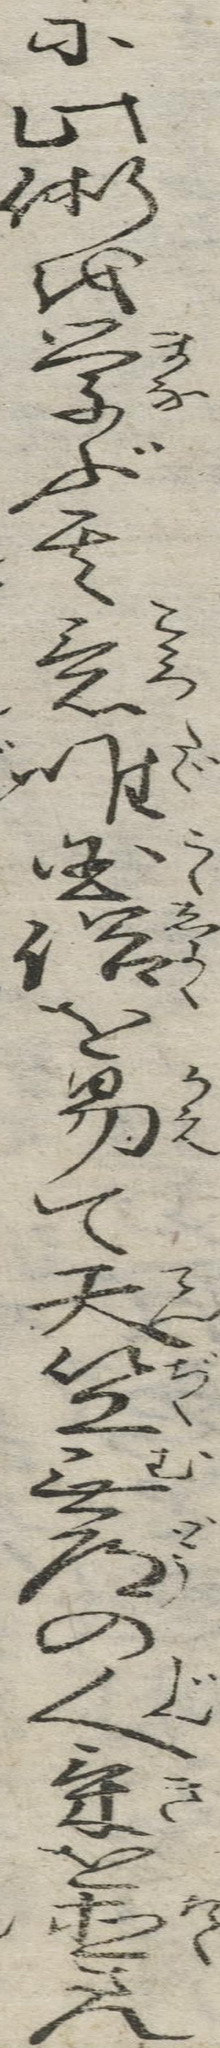に此術を学ぶ其意唯国俗を易て天竺無道の人気を直さん
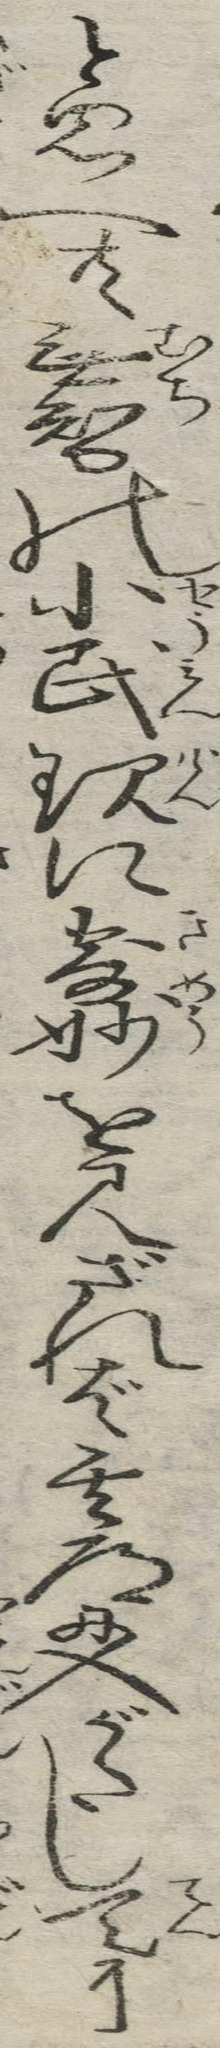と思へども無智の小民現に奇妙を見ざれば其道変がたし天に
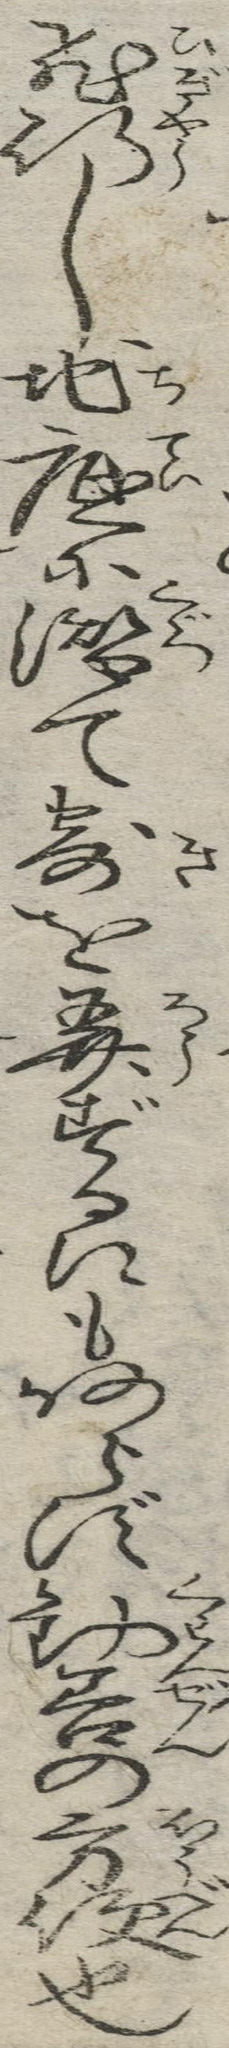飛行し地底に潜て奇を弄ずるにもあらず勧善の方便也
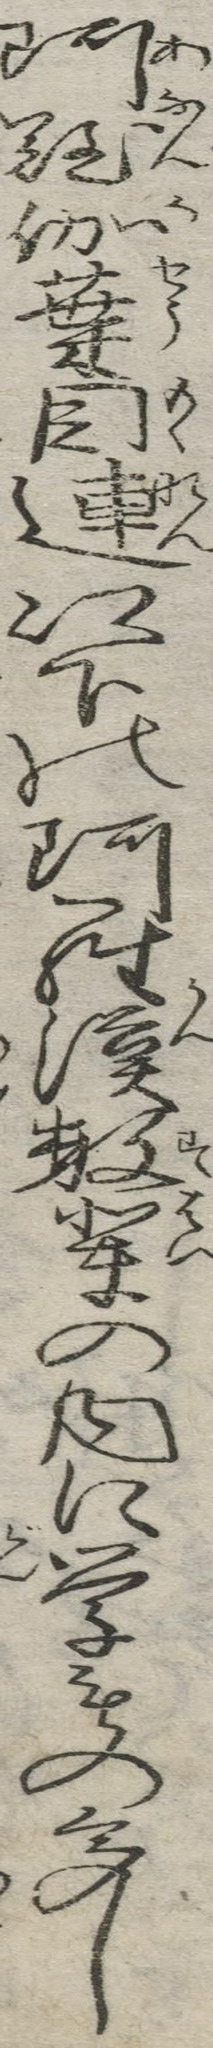阿難伽葉目連以下の阿羅漢数輩の内に学もの多し
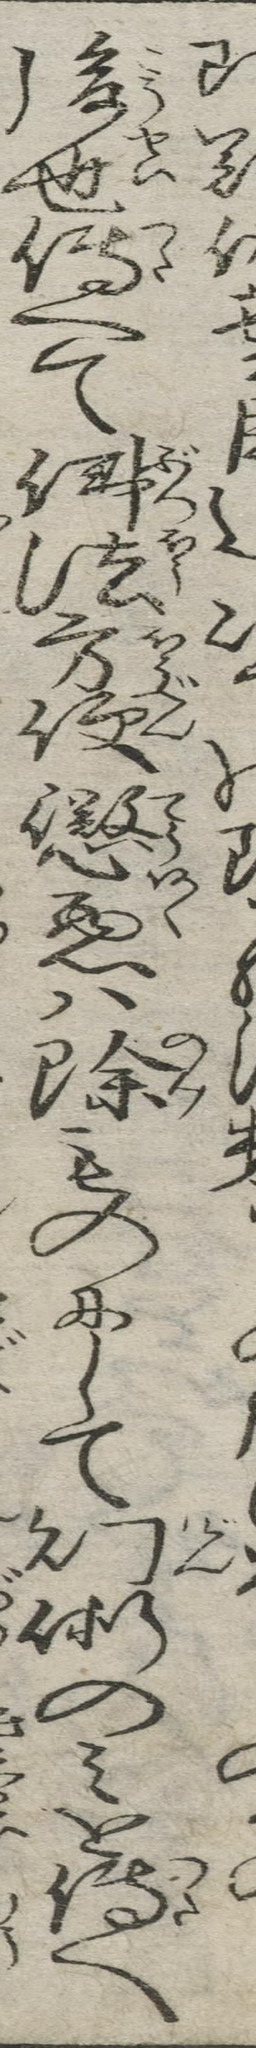後世伝へて佛法方便懲悪は除ものにして幻術のみを伝へ
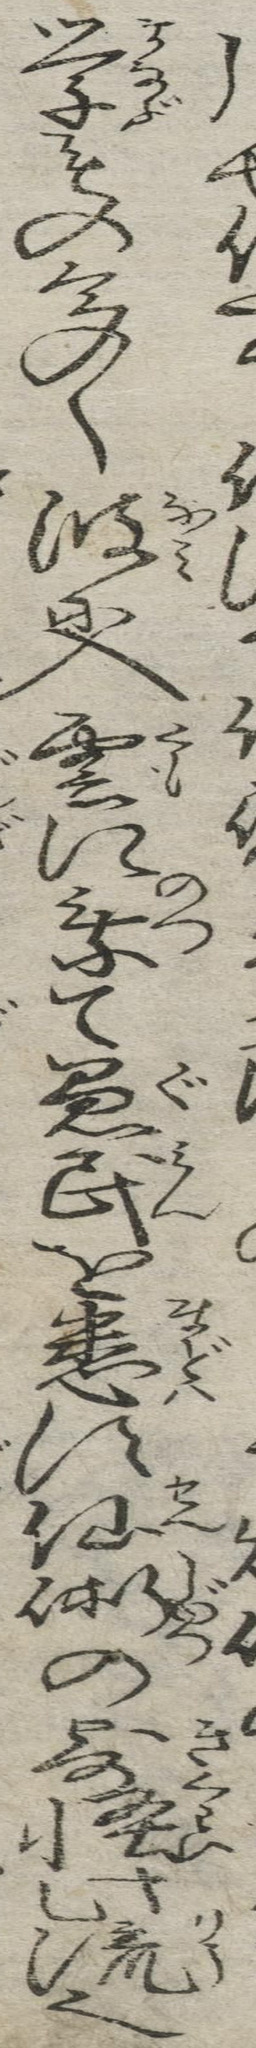学もの多く波に入雲に乗て愚民を患す仙術の奇怪此流也
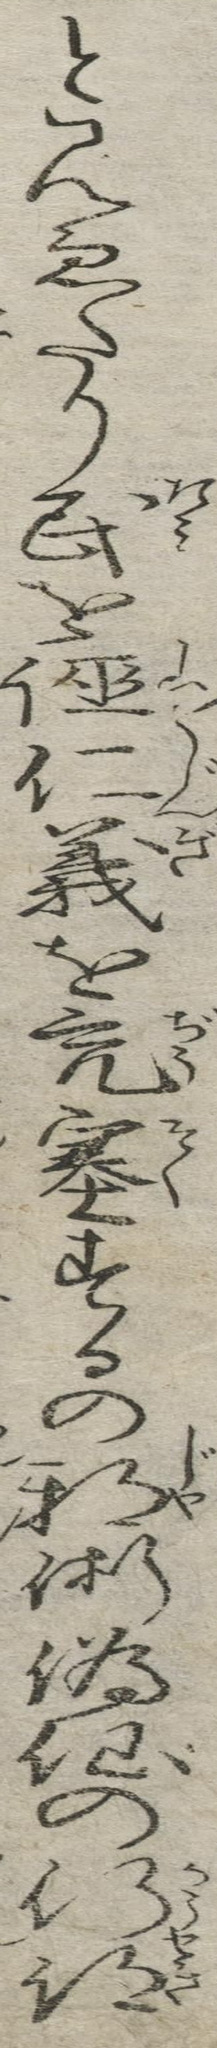と見えたり民を誣仁義を充塞するの邪術偽仙の功績
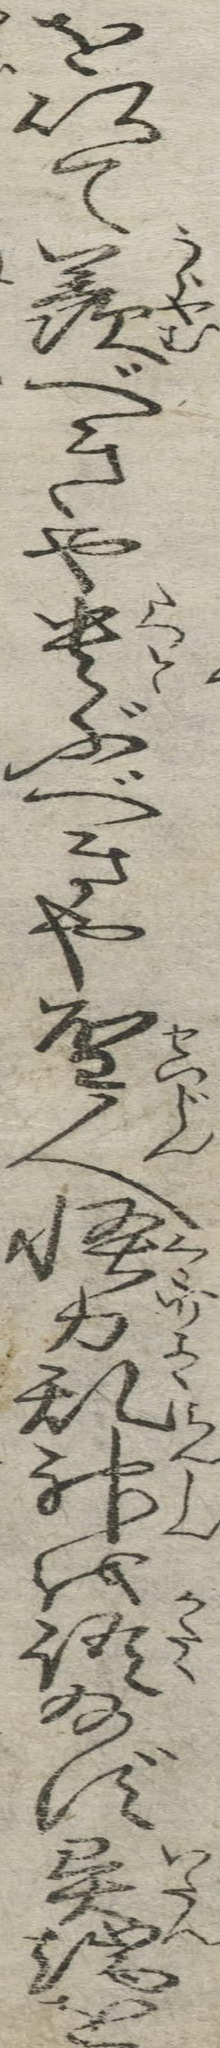を以て羨べきや貴ぶべきや聖人怪力乱神を語はず異端を
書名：訓蒙天地辨　人
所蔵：東京大学地震研究所図書室 Earthquake Research Institute Library, The University of Tokyo, JAPAN
